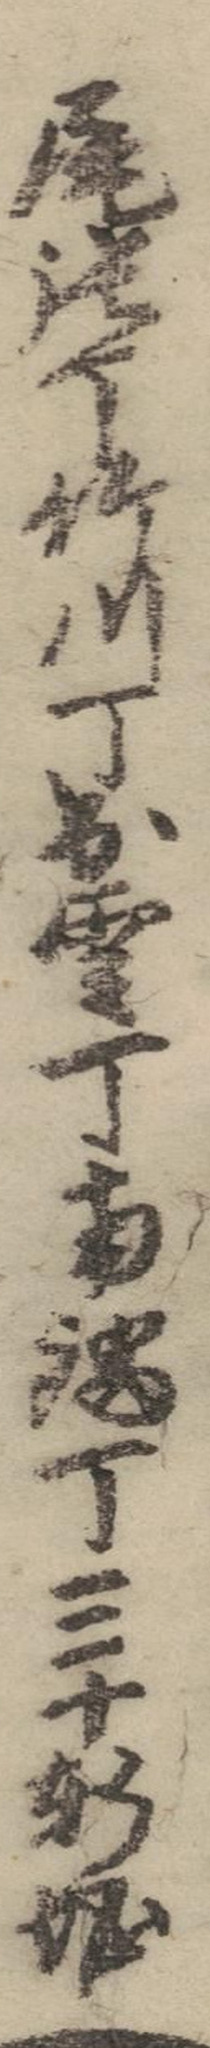尾張丁竹川丁出雲丁南鍋丁三十軒堀
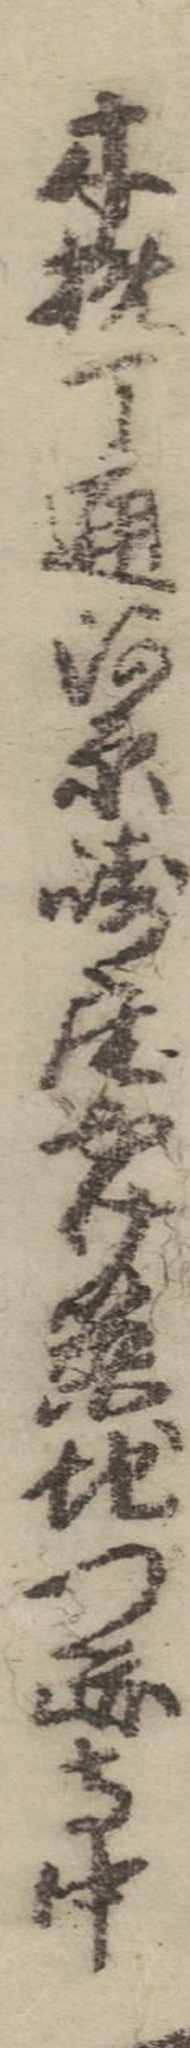木挽丁通瓦崎座やけ築地門跡寺中
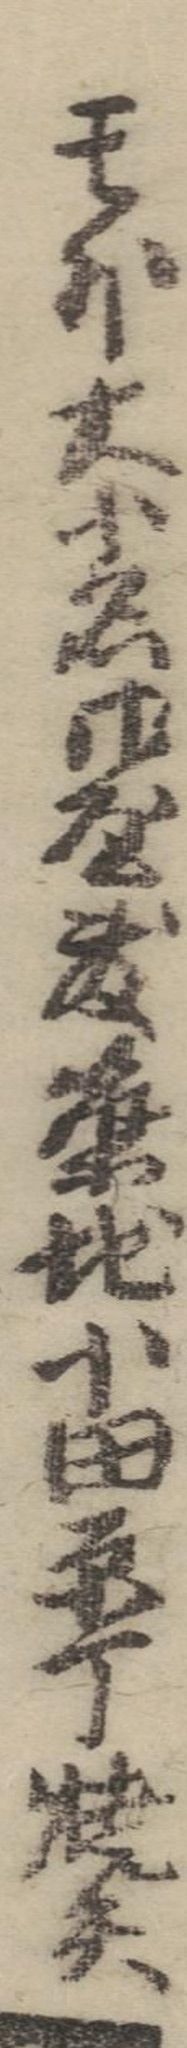其外大小名御屋敷築地小田原丁焼失
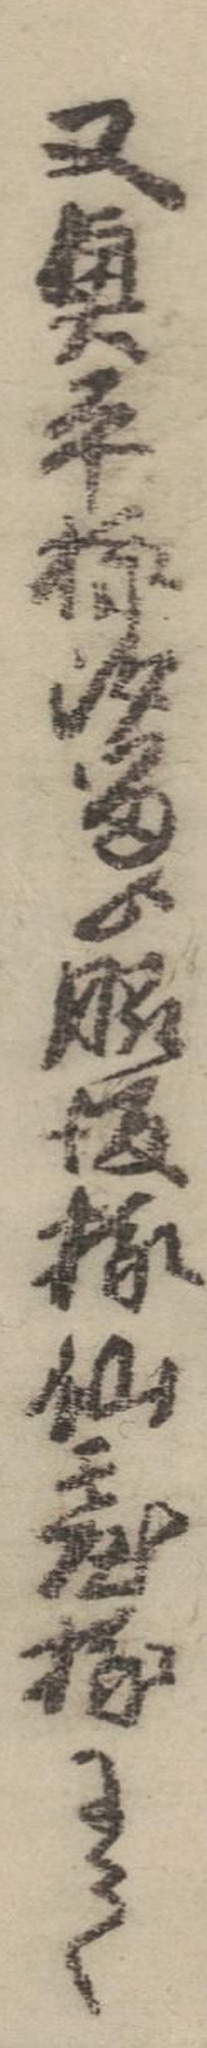又奥平様汐留ゟ脇坂様三大様まて
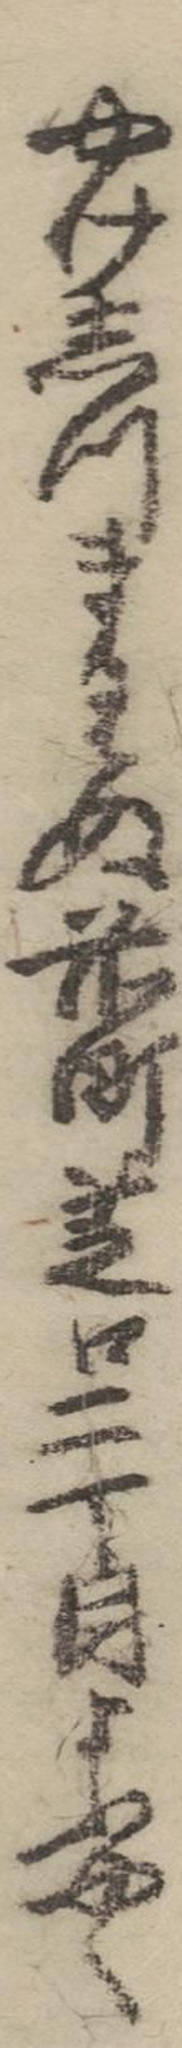やけしつまらぬ花丁柴口二丁目よふやく
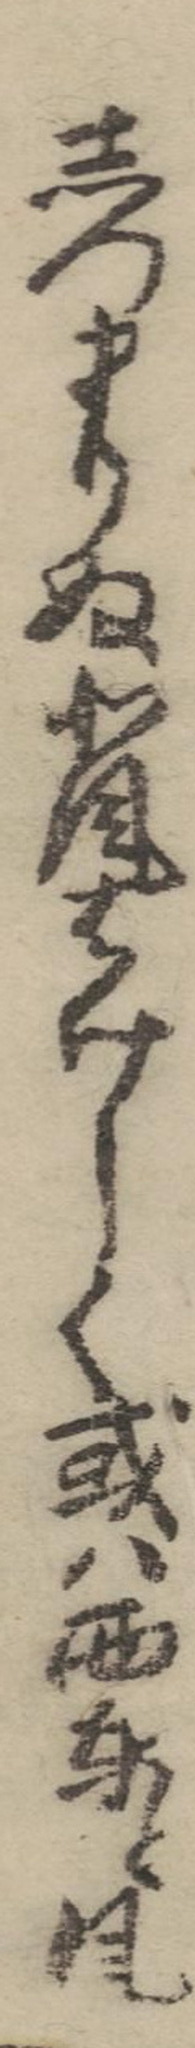しつまりぬ北風はけしく或は西東風
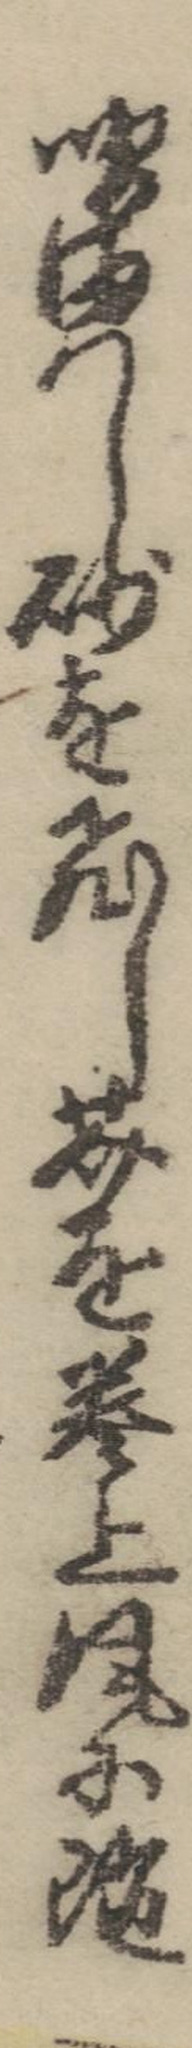吹まわし砂を飛し芥を巻上風に随
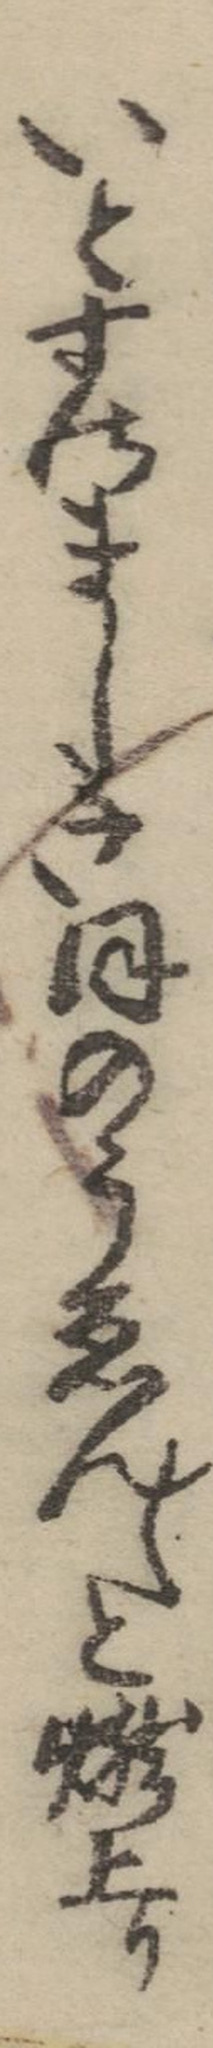いとすさましき同のうゑん〳〵と燃上り
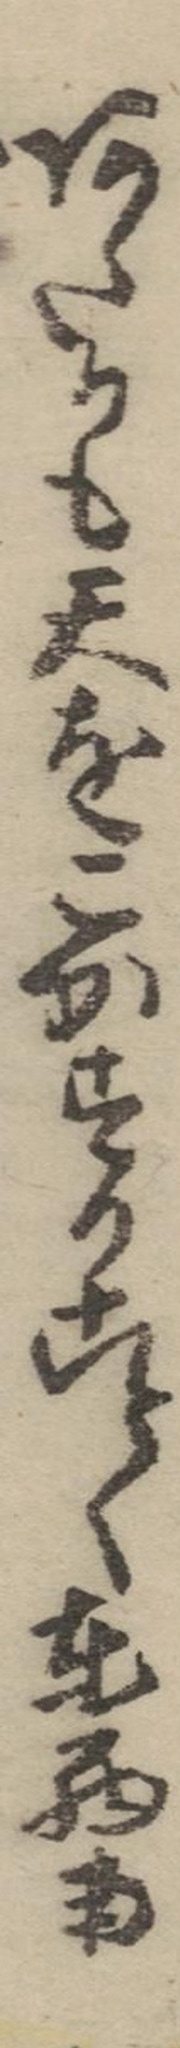あたかも天をこかすかことく東西南
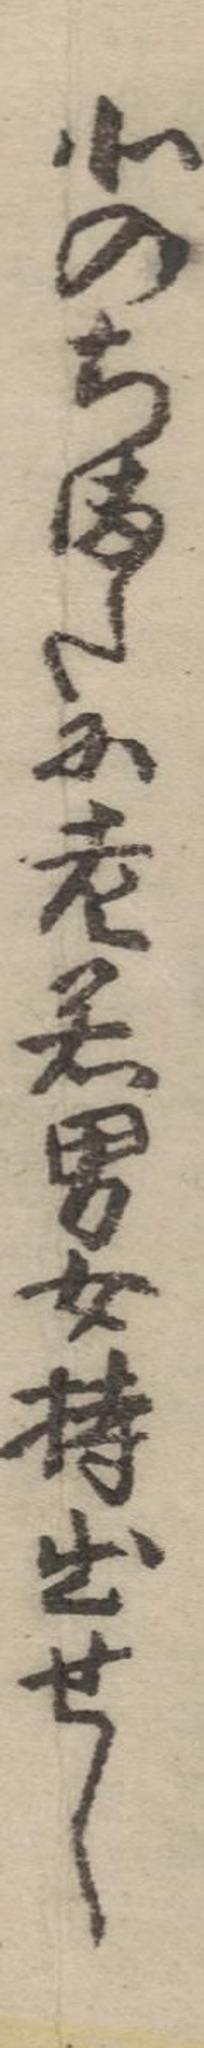北のちまたに老若男女持出せし
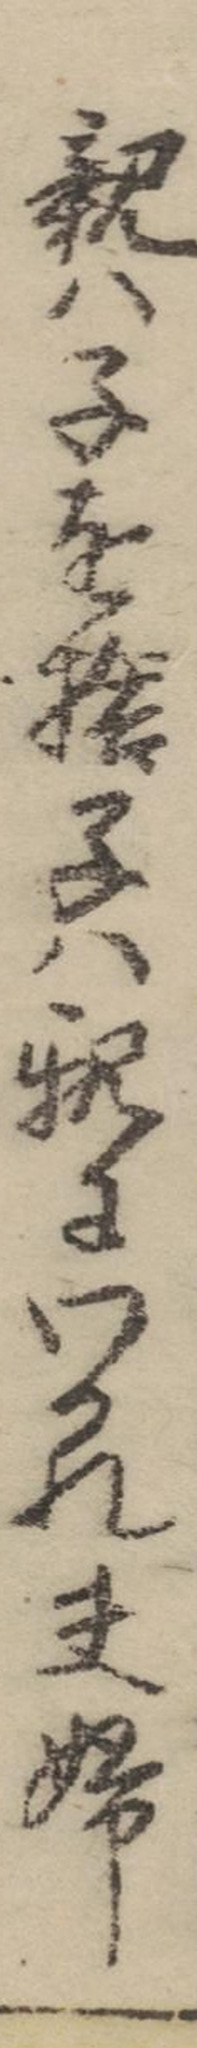親は子を捨子は親にはわかれ夫婦
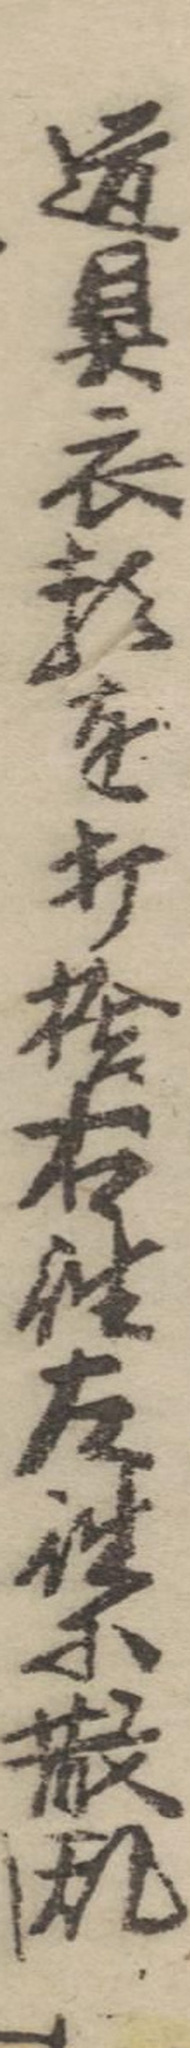道具衣類を打捨右往左往に散乱し
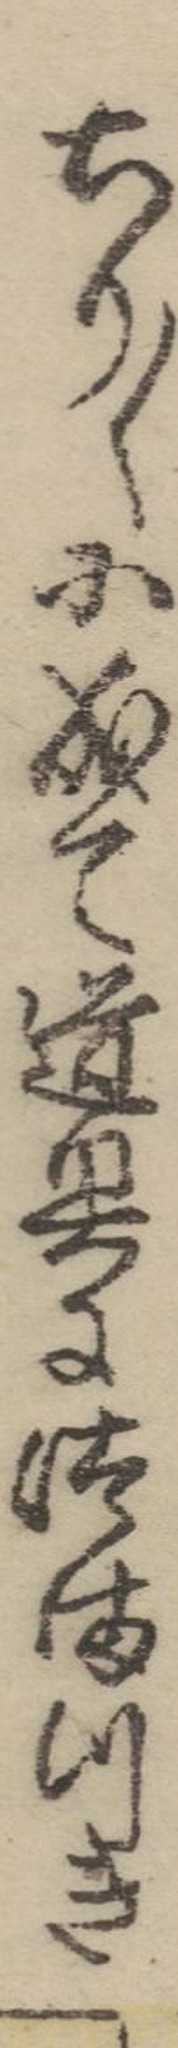ちり〳〵に成て道具につまつき
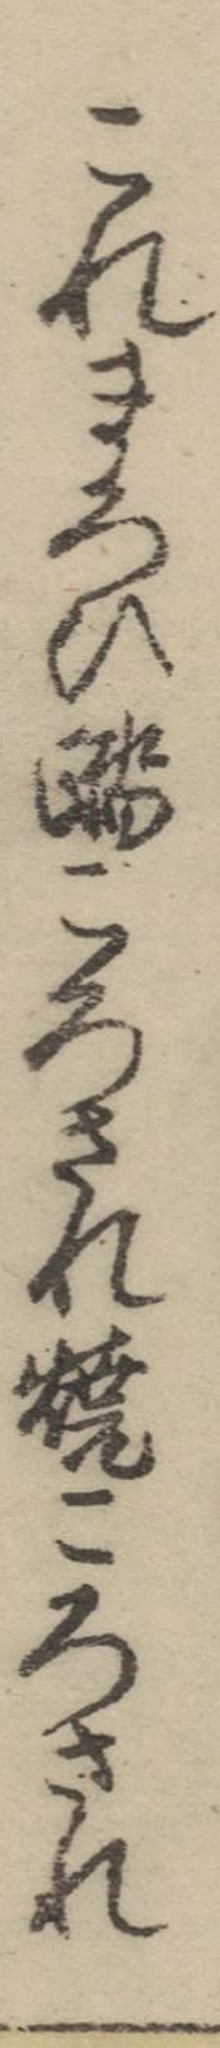これまろひ踏ころされ焼ころされ
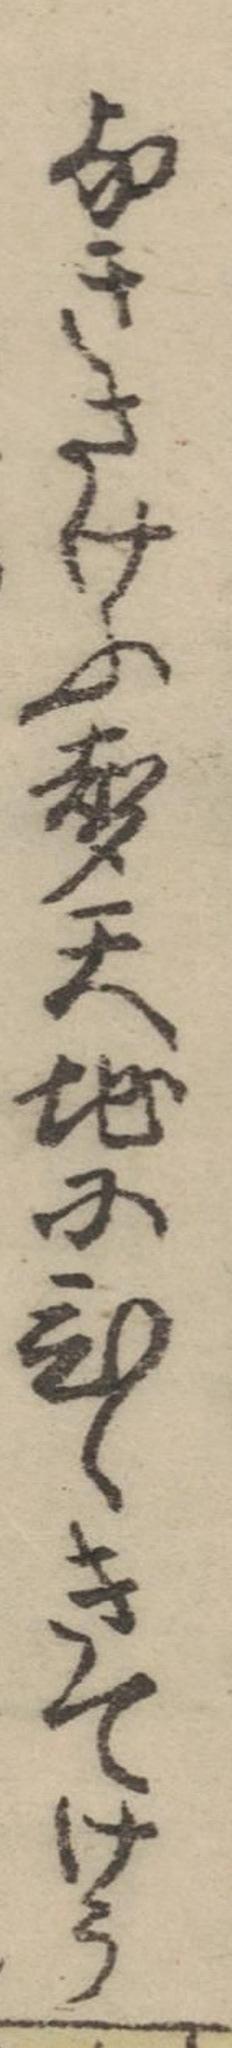なきさけぶ声天地にひゞきてけう
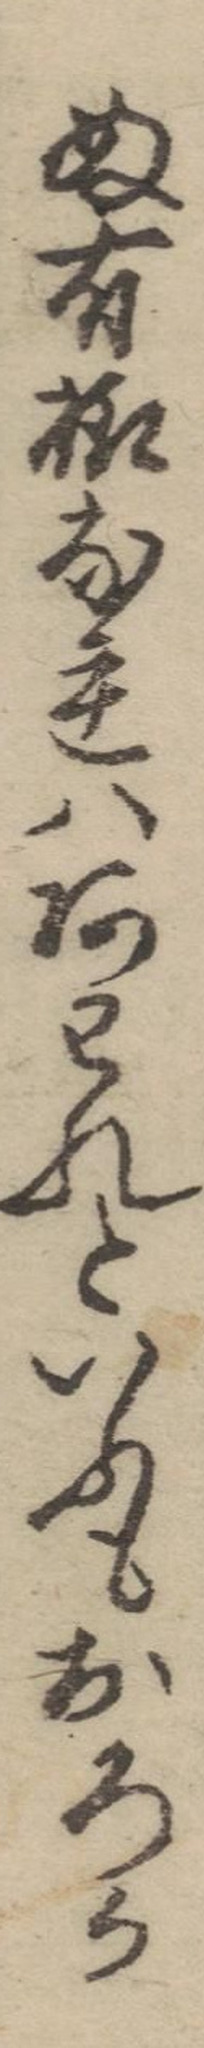ぬ有様ならはあわれといふもおろか
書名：[天保五年二月の江戸大火に関する瓦版]
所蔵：東京大学地震研究所図書室 Earthquake Research Institute Library, The University of Tokyo, JAPAN
